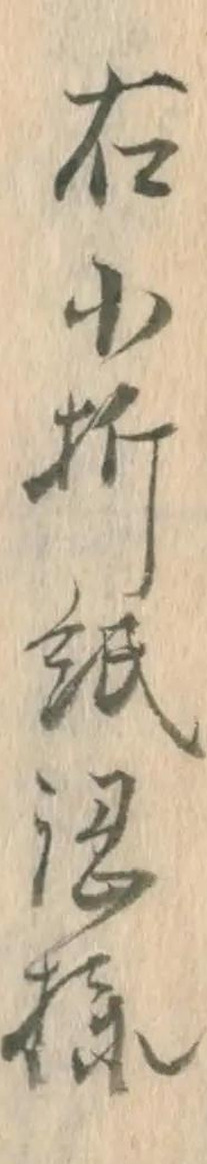右小折紙認様

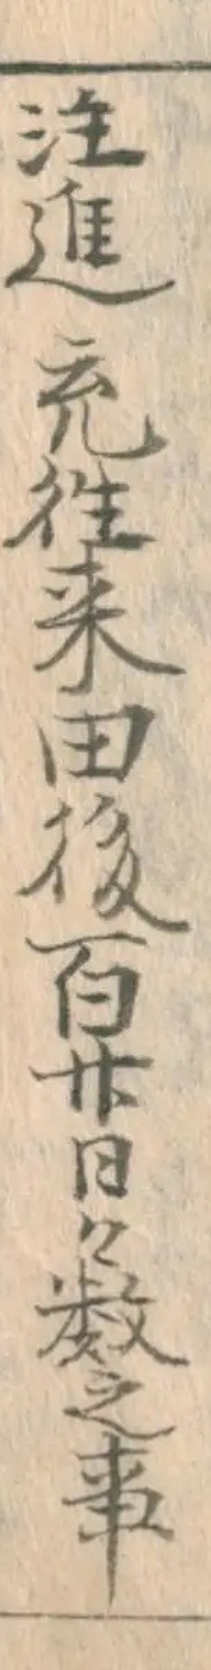注進充往来田後百廿日々数之事
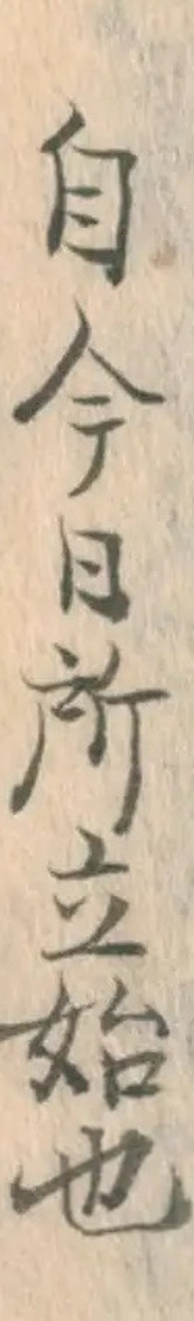自今日所立始也
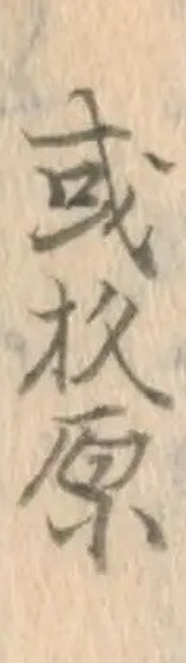或杉原
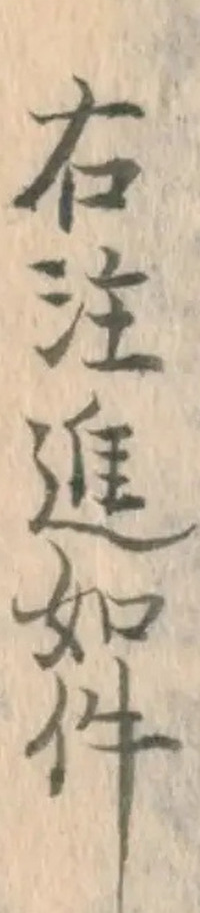右注進如件
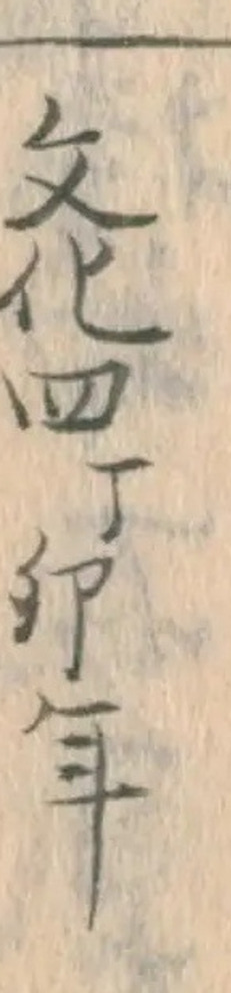文化四丁卯年
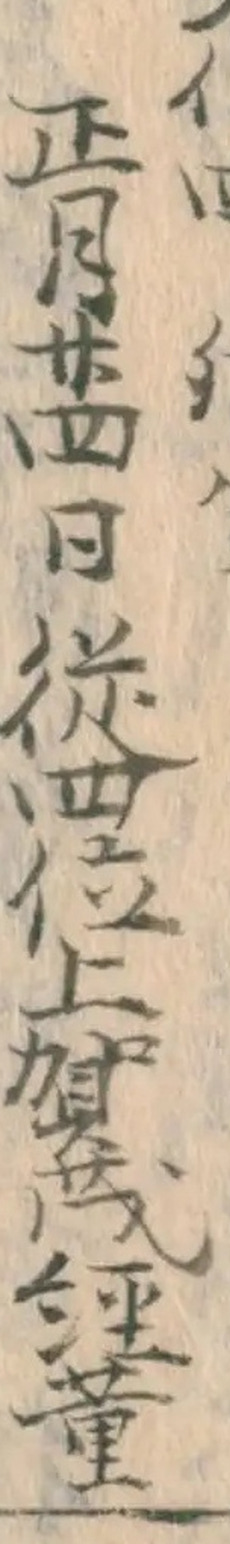正月廿四日従四位上賀茂経董
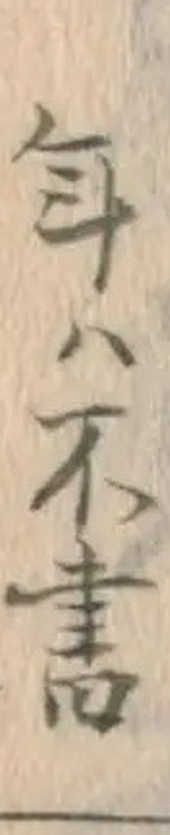年ハ不書
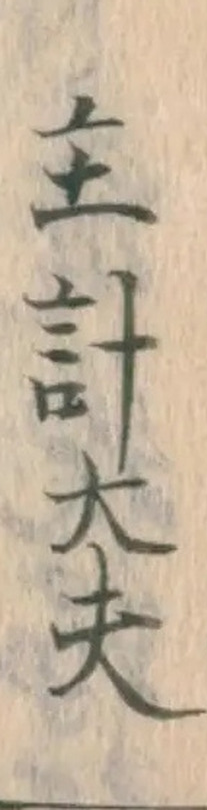主計大夫
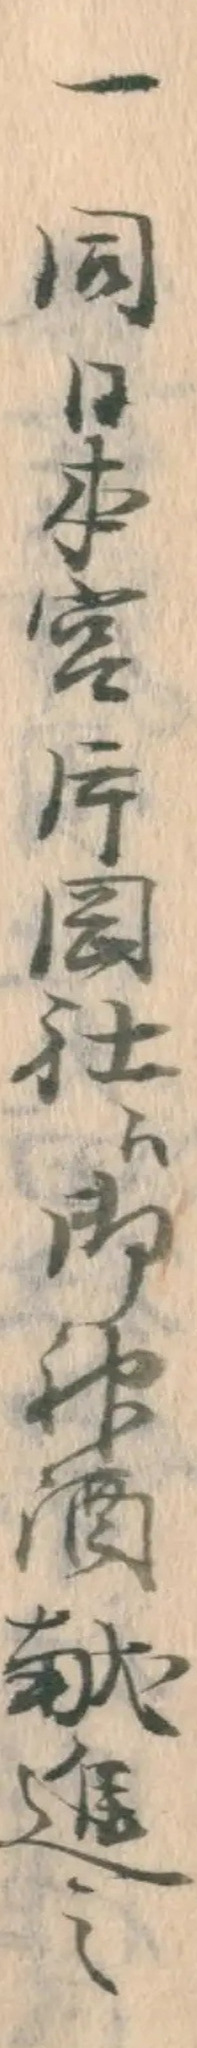一同日本宮片岡社え御神酒献進之
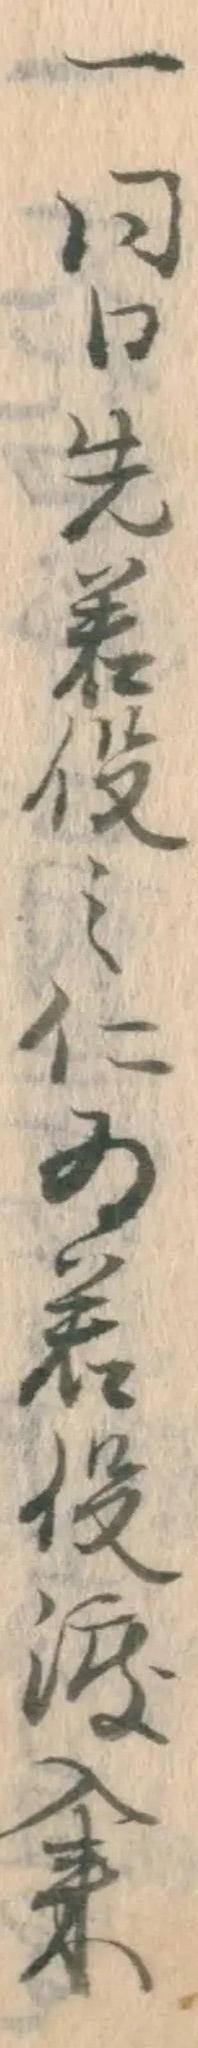一同日先若役之仁為若役渡入来
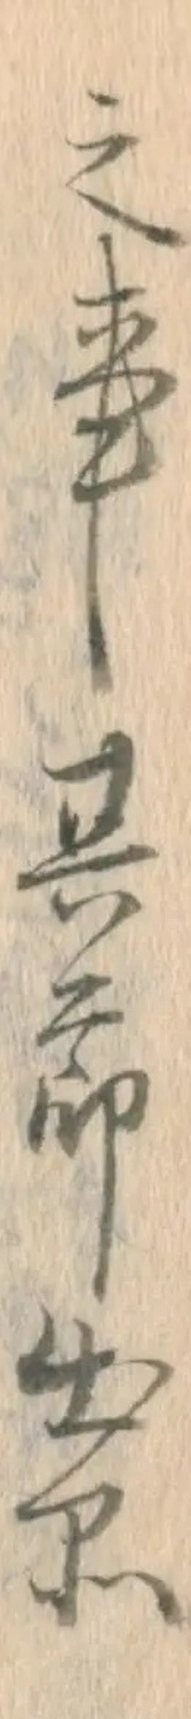之事其節出品
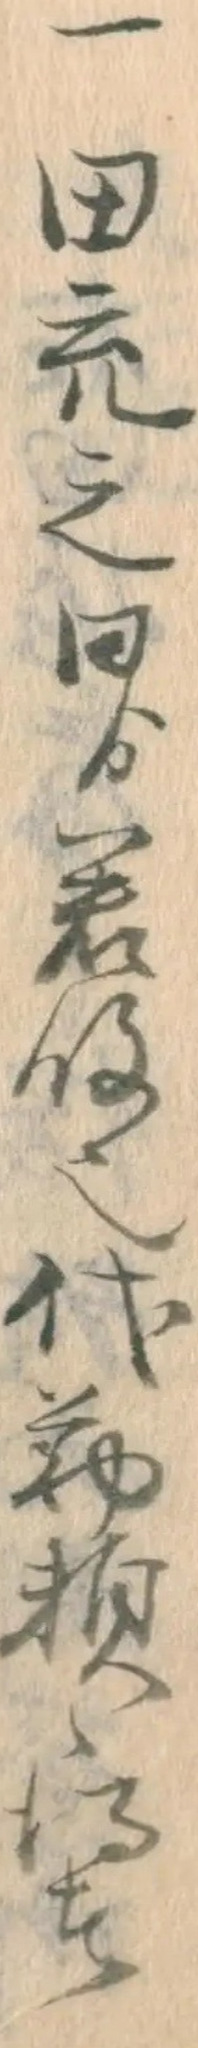一田充之日ゟ若役之代勤頼候得者
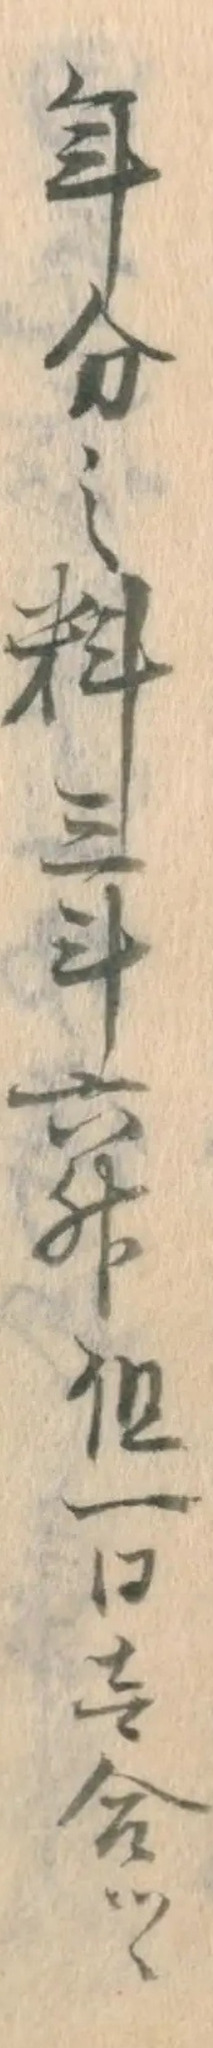年分之料三斗六升但一日壱合ツヽ

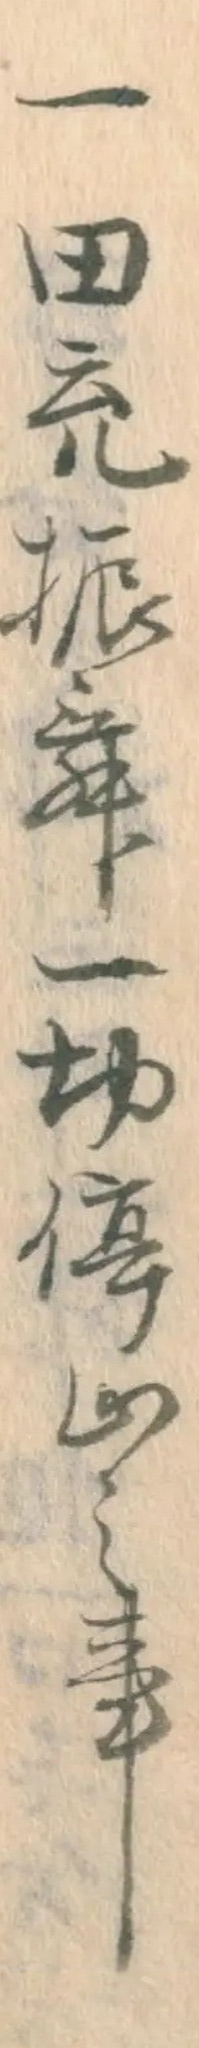一田充振舞一切停止之事
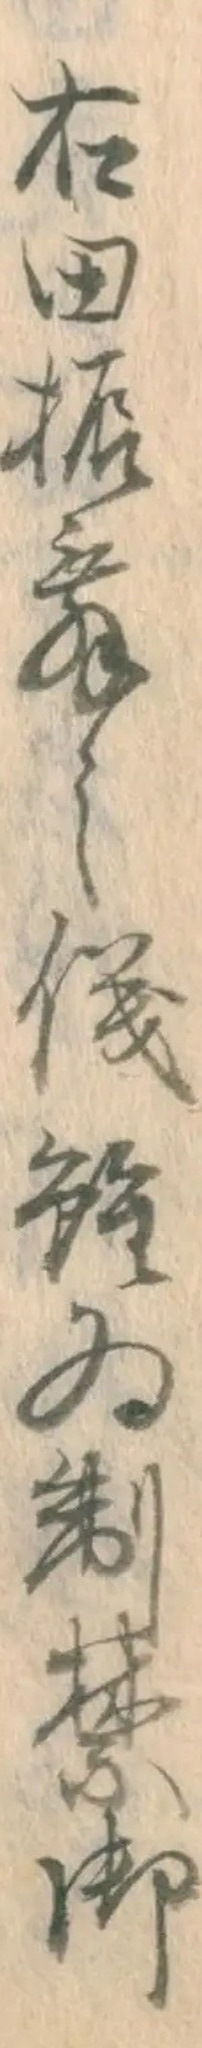右田振舞之儀雖為制禁御
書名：賀茂社記録. 第81冊
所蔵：国立国会図書館 National Diet Library, JAPAN
